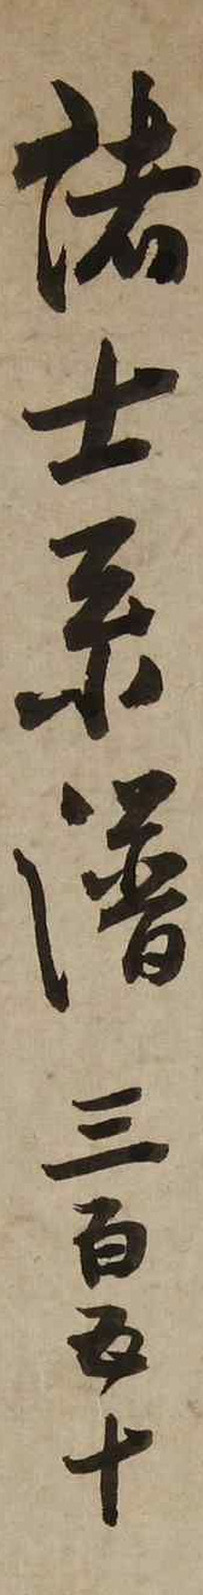諸士系譜三百五十

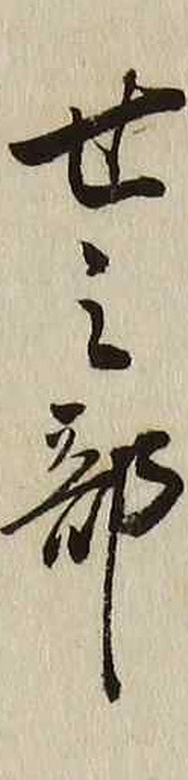せ之部
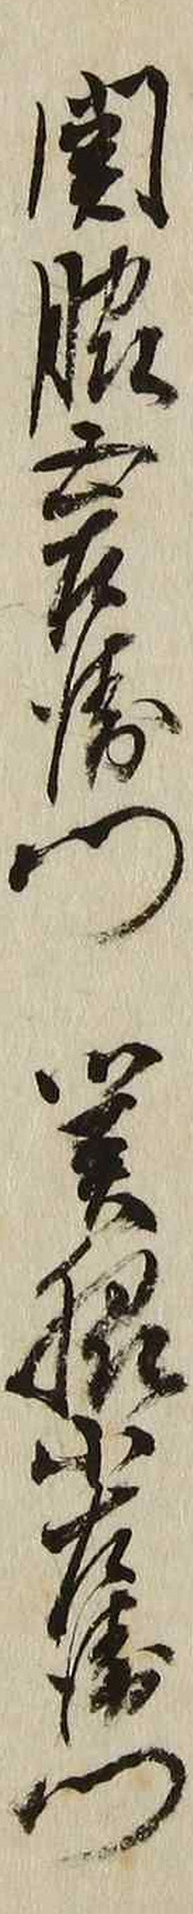関脇五左衛門関脇小左衛門
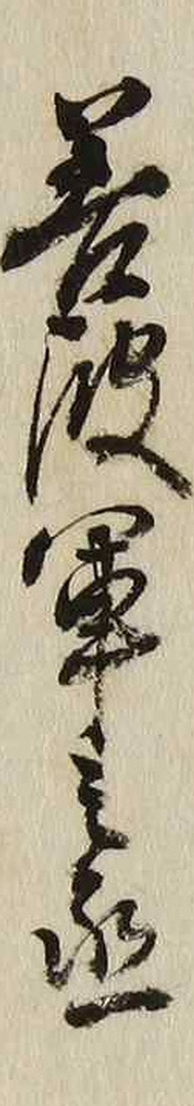善波軍之丞

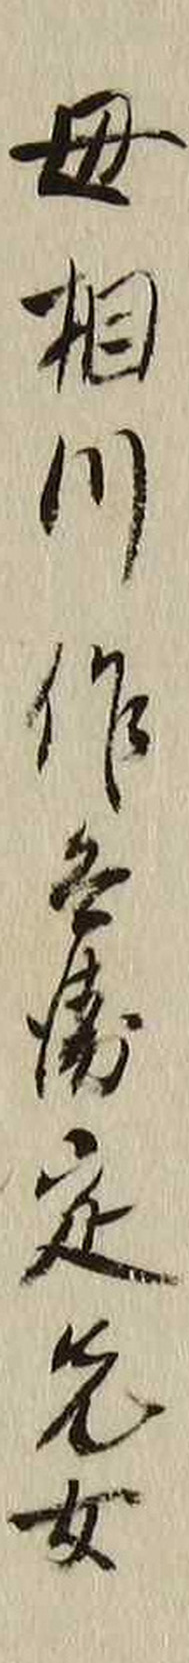母相川作兵衛定先女
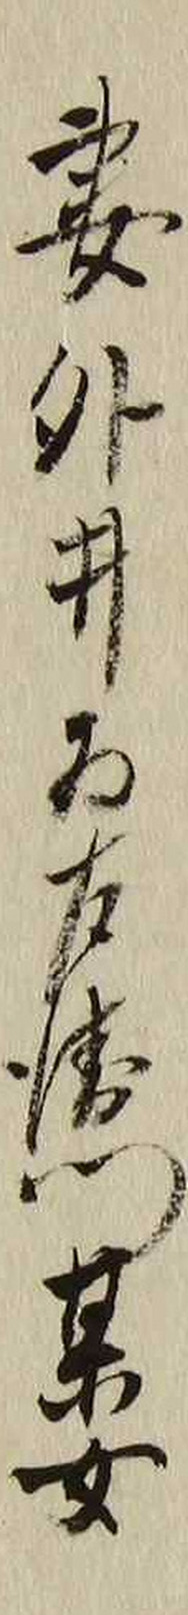妻外井為左衛門某女
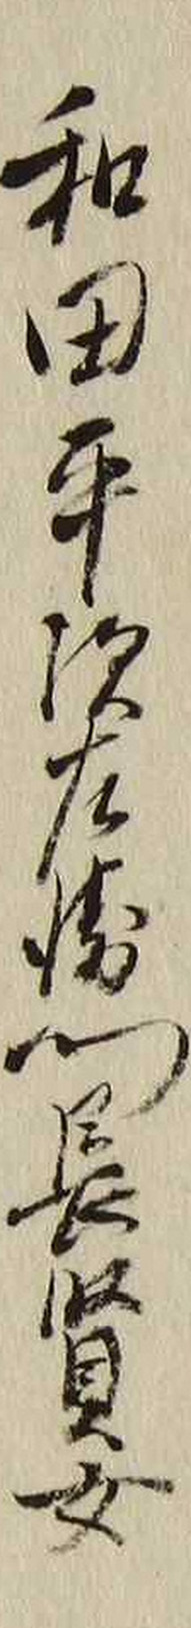和田平次左衛門長賢女
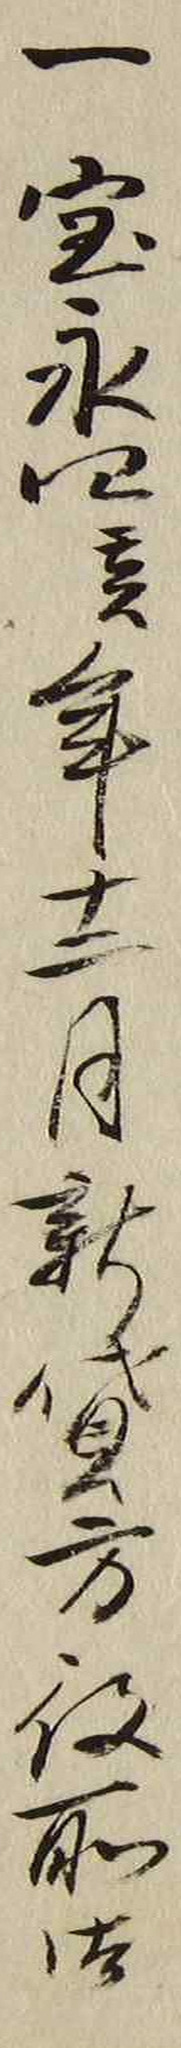一宝永四亥年十二月新貸方役所御
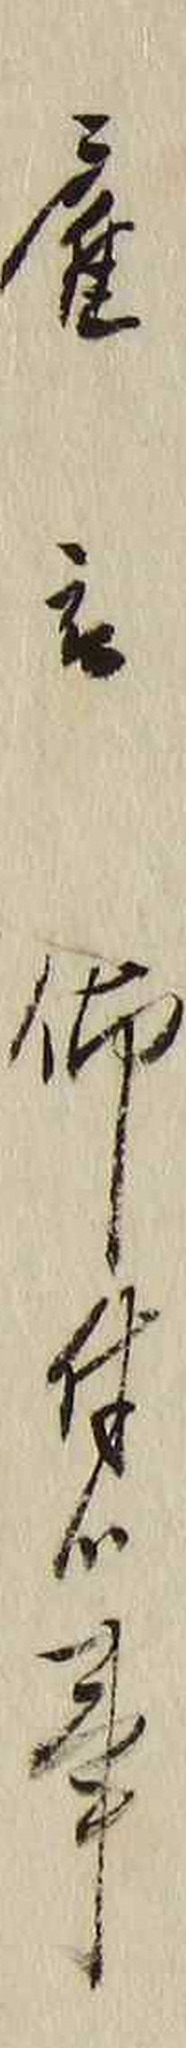雇被仰付候事

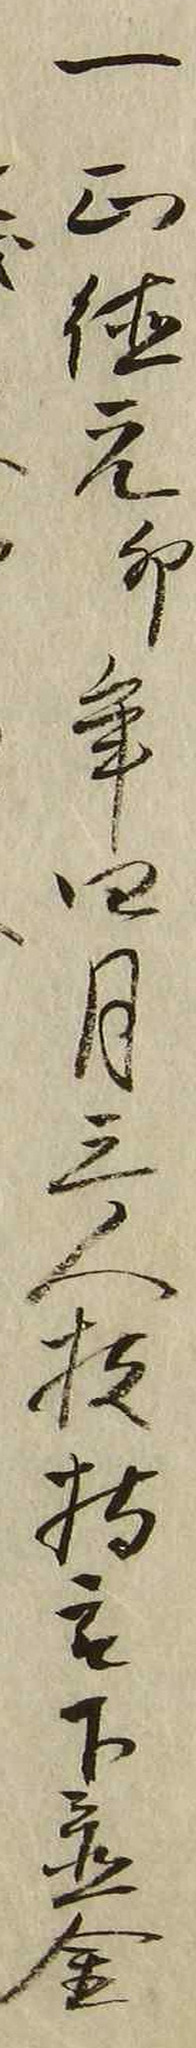一正徳元卯年四月三人扶持被下置金
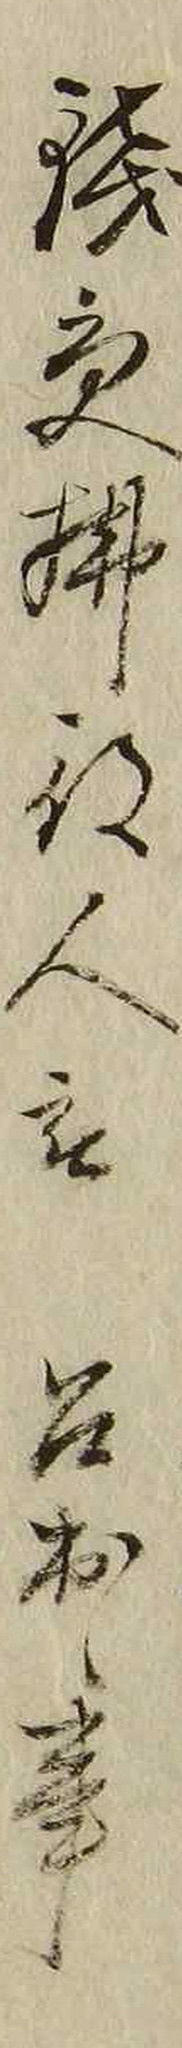銭受払役人被召出候事
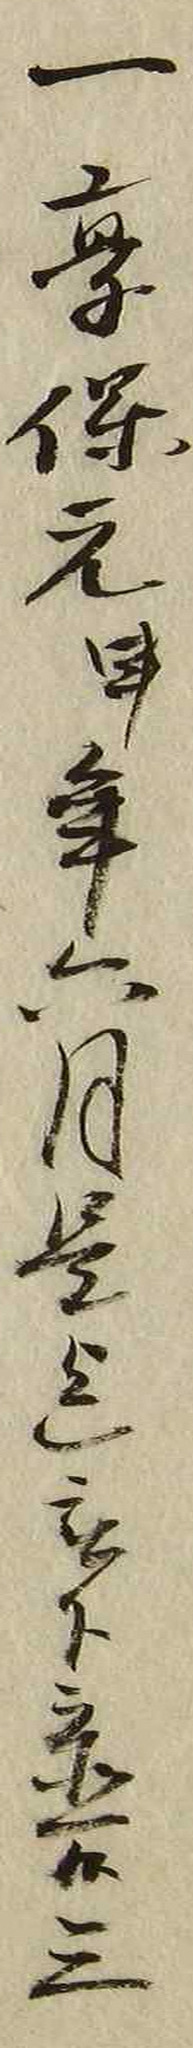一享保元申年六月是迄被下置候三
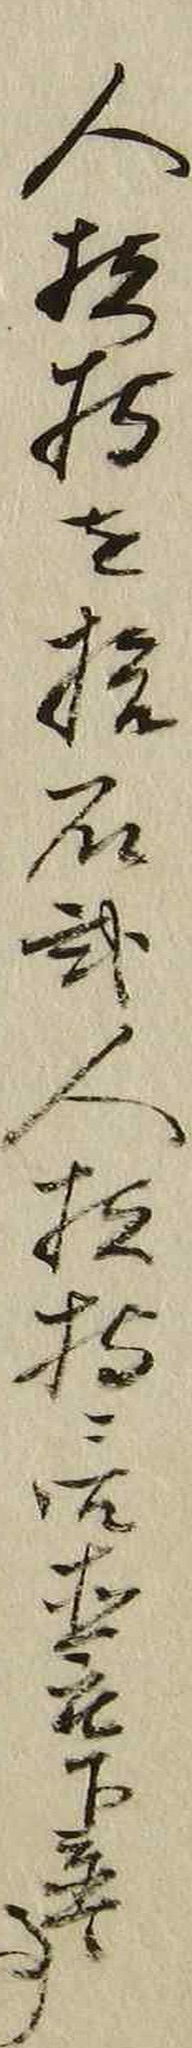人扶持を拾石弐人扶持御直被下置候事
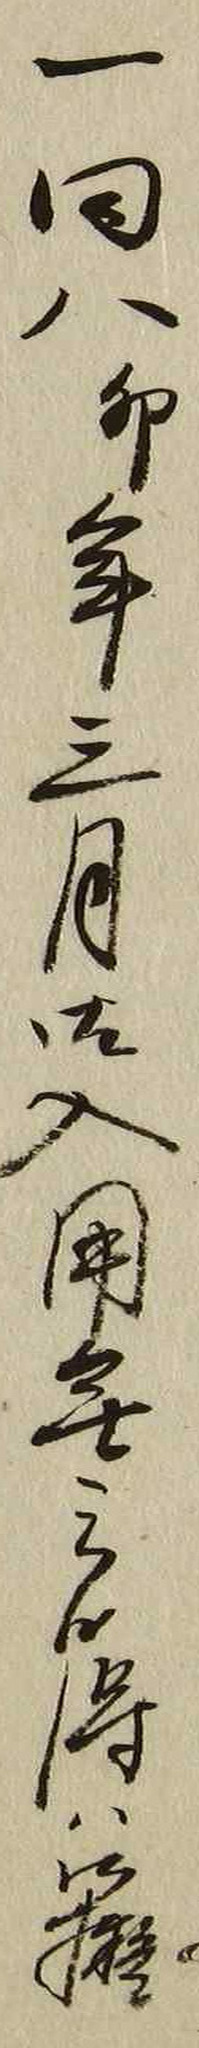一同八卯年三月御入用無之候得ハ御擬
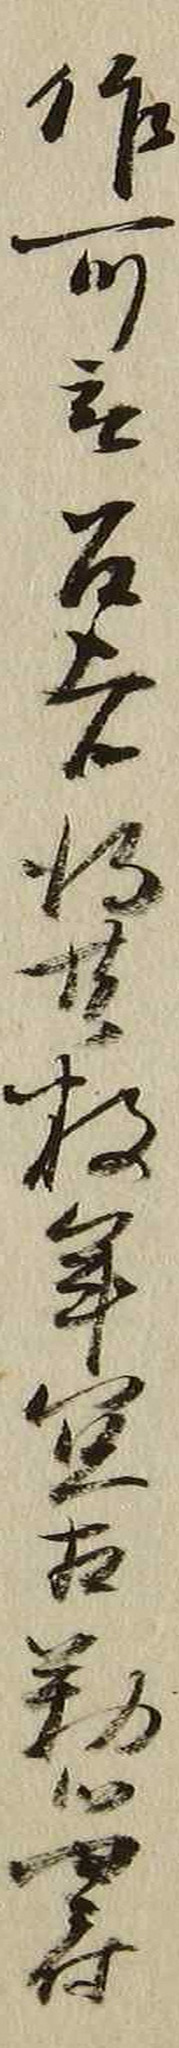作可被召上候得共数年宜相勤候由付
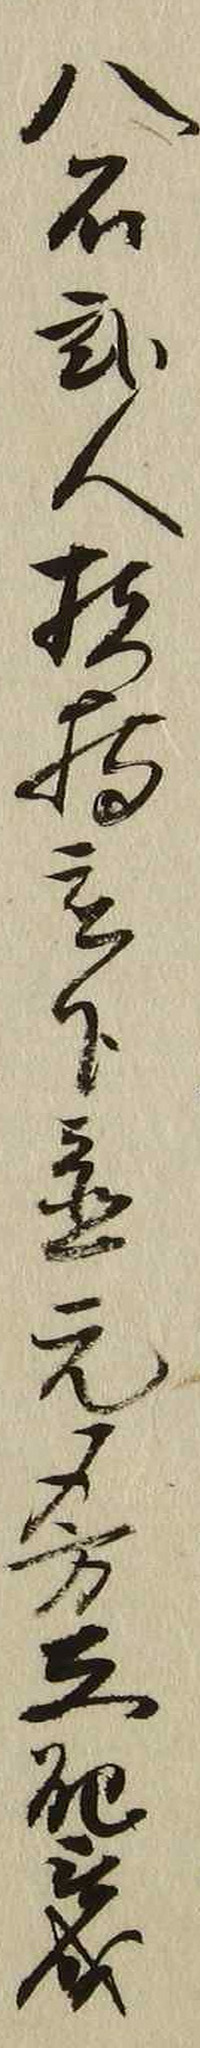八石弐人扶持被下置元〆方支配被成
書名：諸士系譜　巻之350　せ之部1冊全
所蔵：会津若松市立会津図書館
